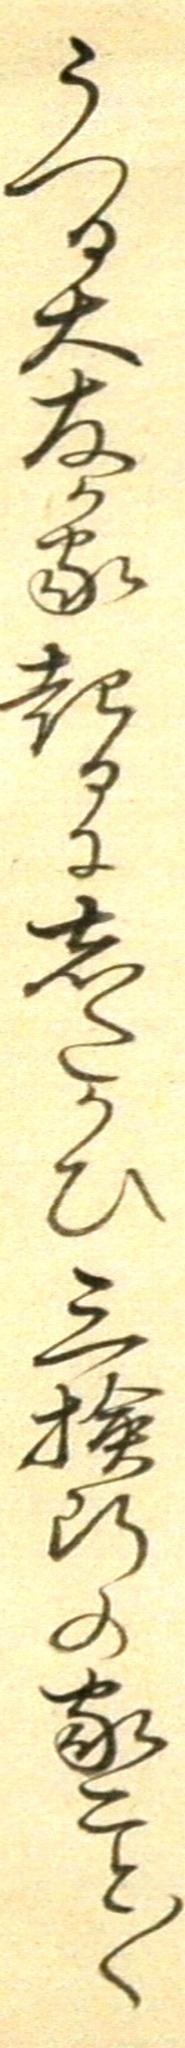うつる大友か家起るにしたかひ三検断の家こと〳〵
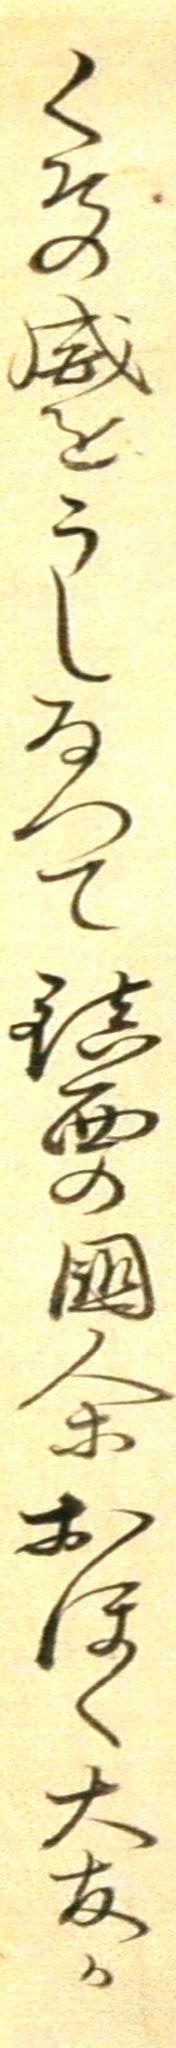くその威をうしなつて鎮西の国人等おほく大友か

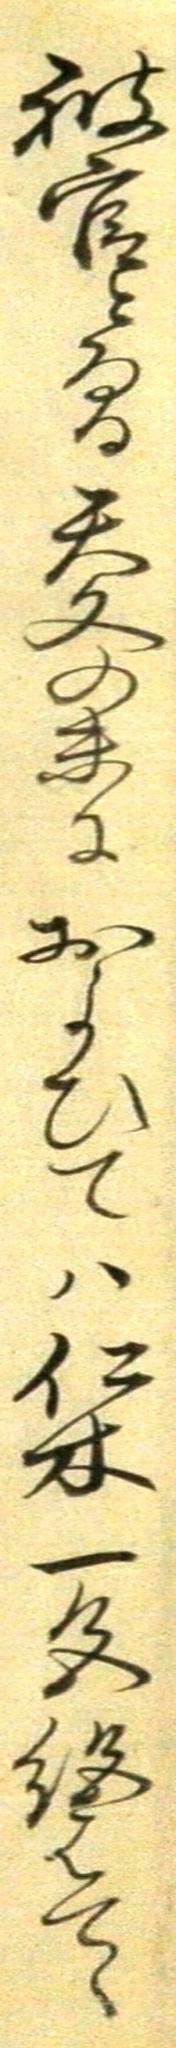被官となる天文の末におよひては仁木一色絶はてゝ
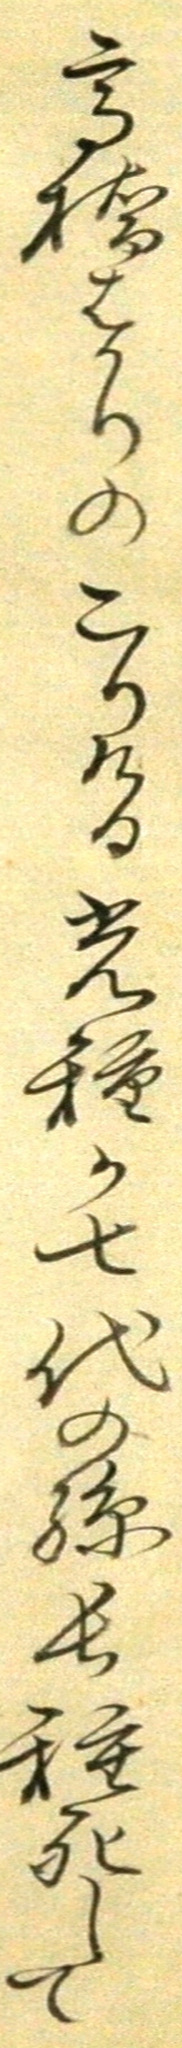高橋はかりのこりける光種か七代の孫長種死して
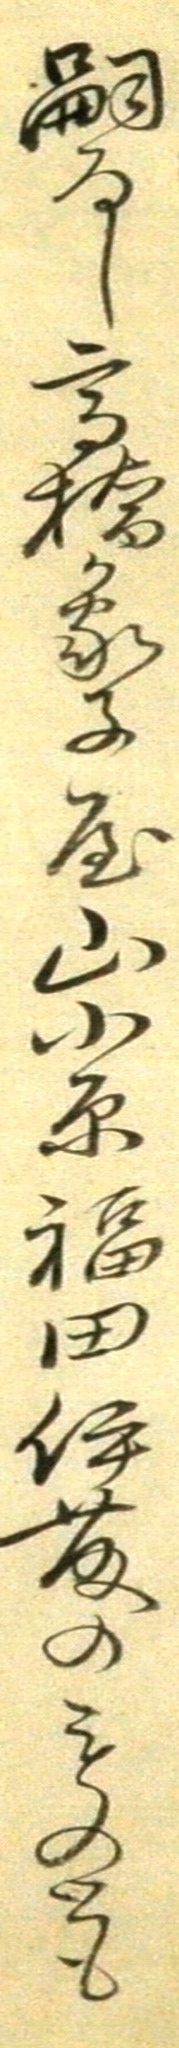嗣なし高橋か家子屋山小原福田伊藤のものとも
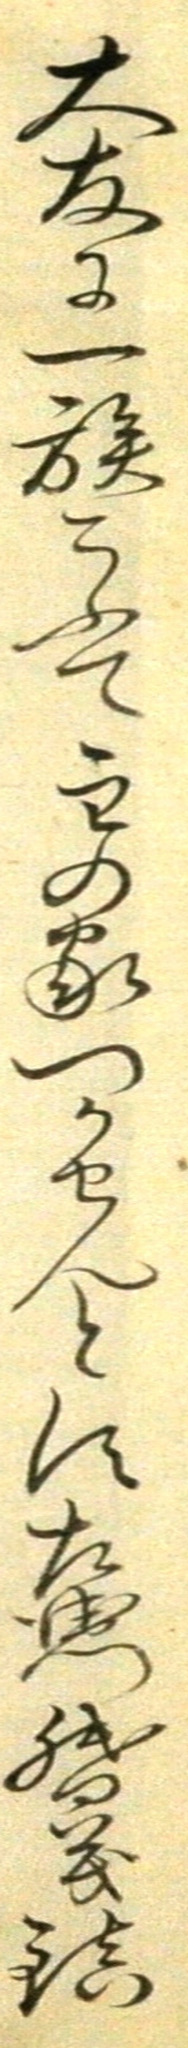大友に一族こふて主の家つかせんとす左衛門督義鎮
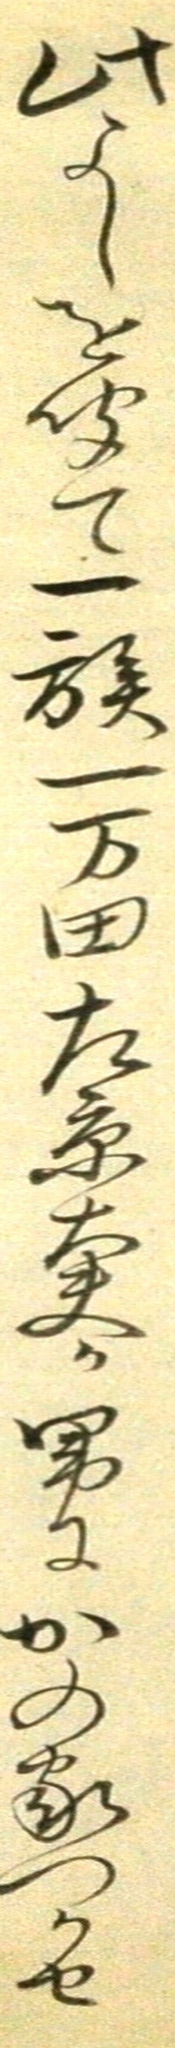此よしを聞て一族一万田左京大夫か男にかの家つかせ
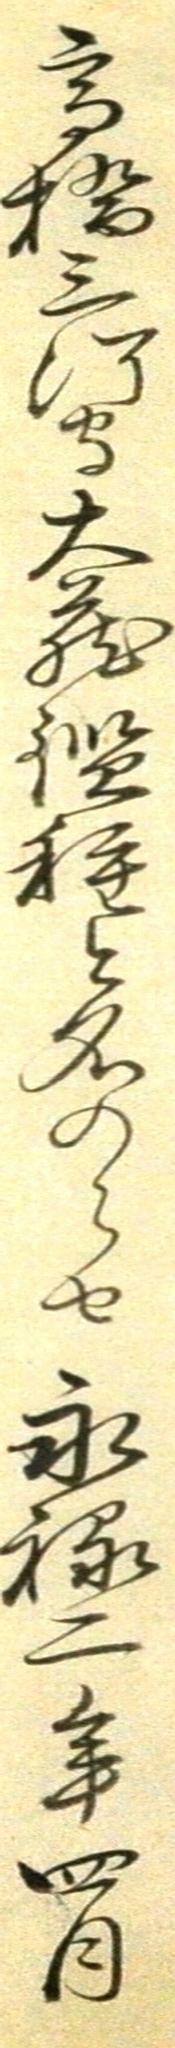高橋三河守大蔵鑑種と名のらせ永禄二年四月
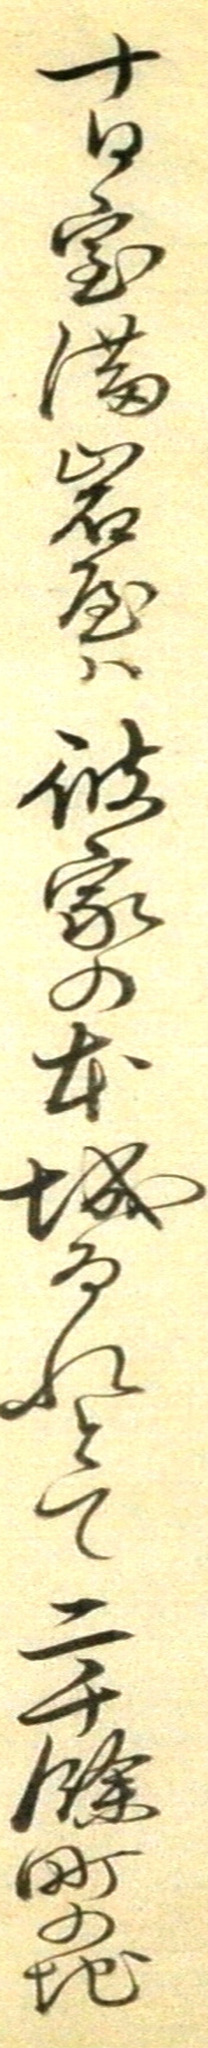十日宝満岩屋は彼家の本城なれとて二千余町の地
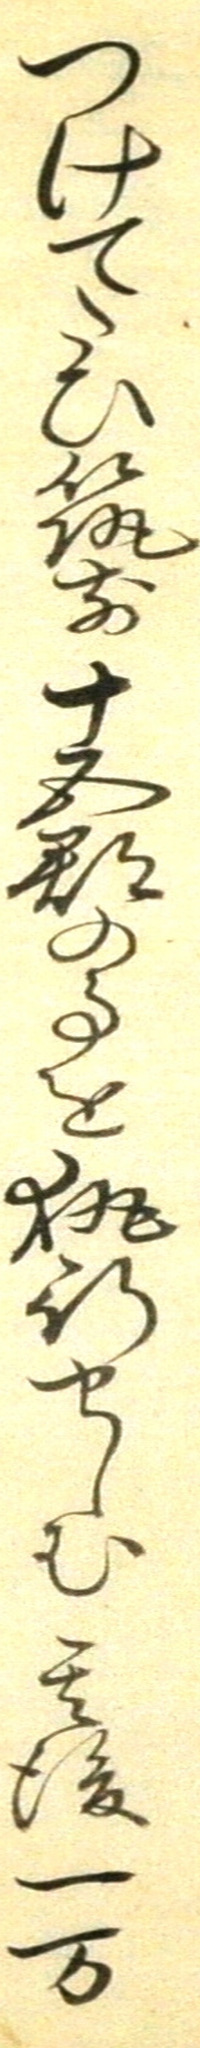つけてたひ筑前十五郡の事を執行せしむ其後一万
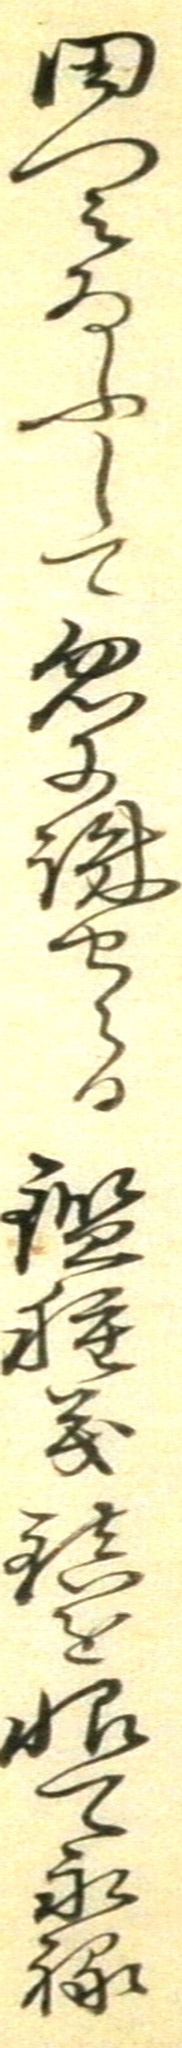田つみなふして忽に誅せらる鑑種義鎮を恨て永禄
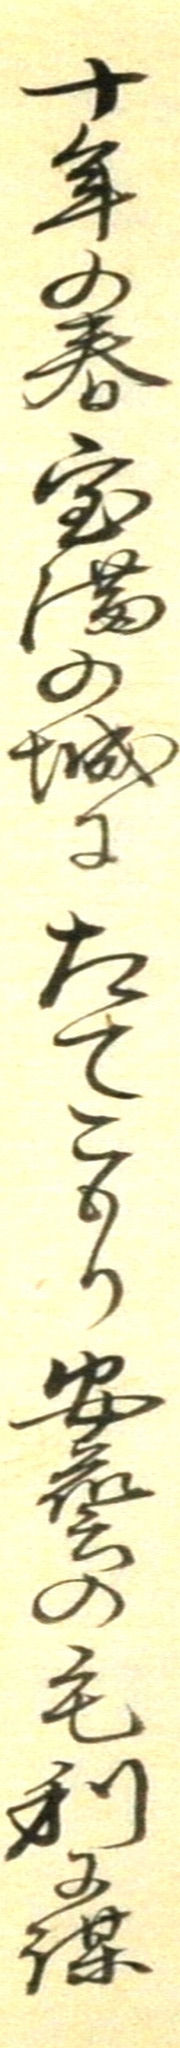十年の春宝満の城にたてこもり安芸の毛利に謀
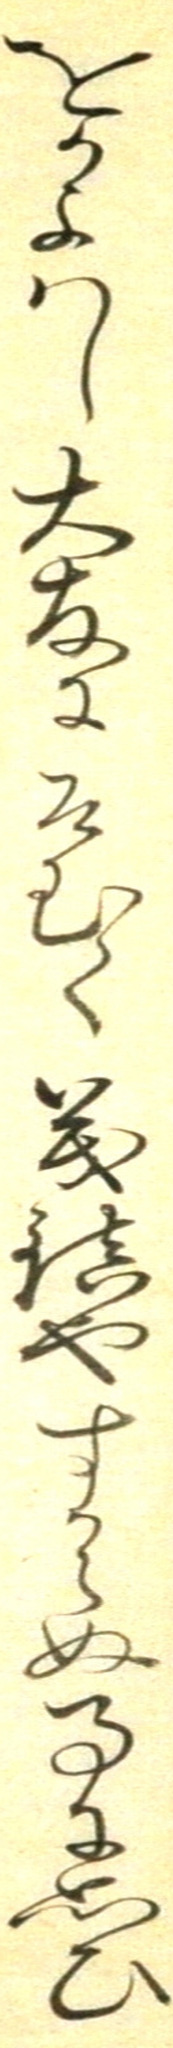をかよはし大友にそむく義鎮やすからぬ事に思ひ
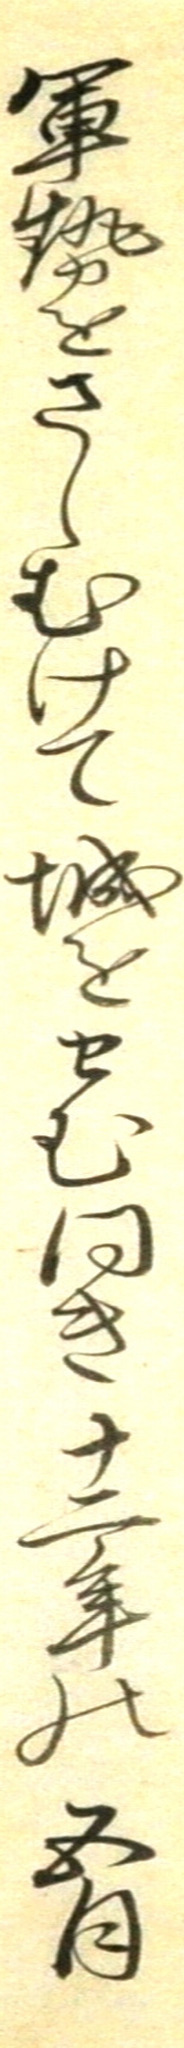軍勢をさしむけて城をせむ同き十二年の五月
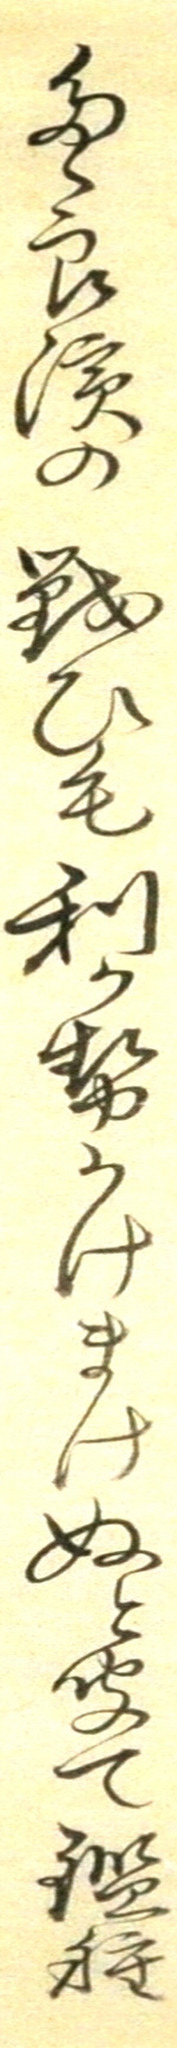たゝら浜の戦ひ毛利か勢かけまけぬと聞て鑑種
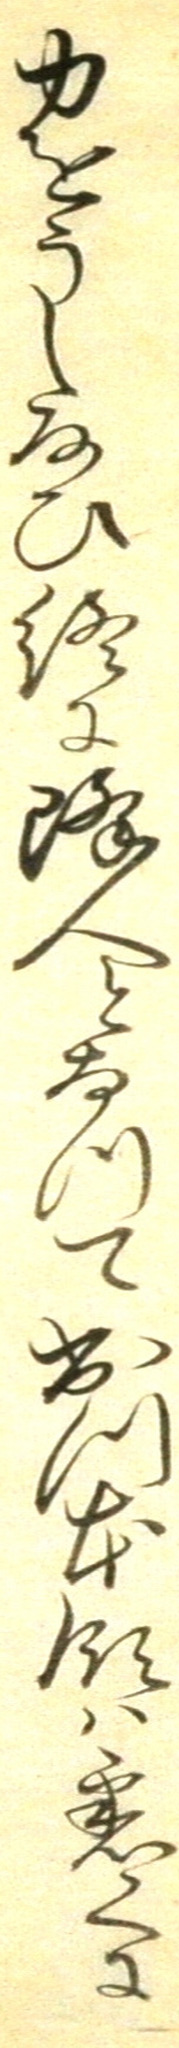力をうしなひ終に降人となつて出つ本領は悉くに
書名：藩翰譜（八・下）
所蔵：伊那市立高遠町図書館・合同会社AMANE
